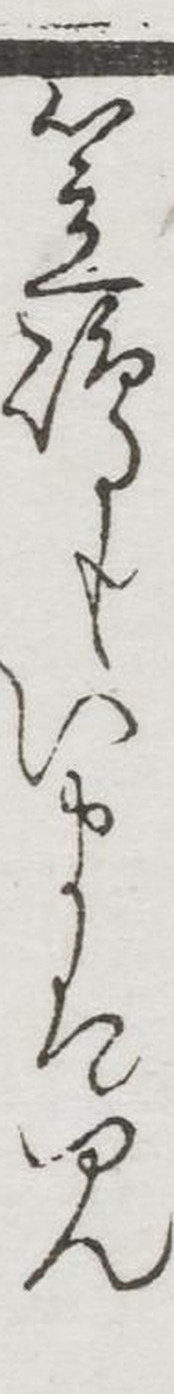笠島もいまは見
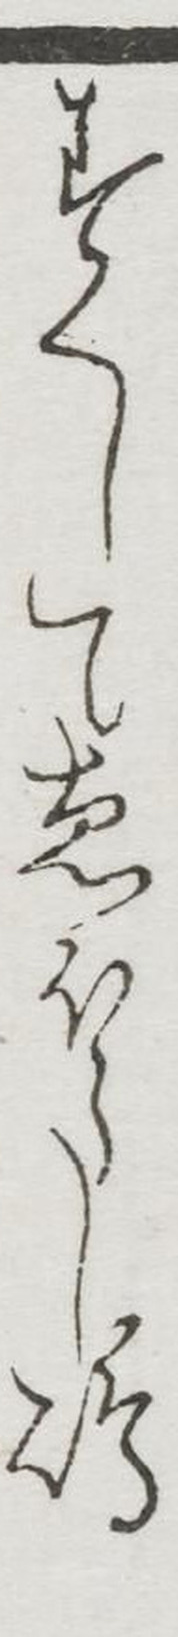すくしてゑほうし島
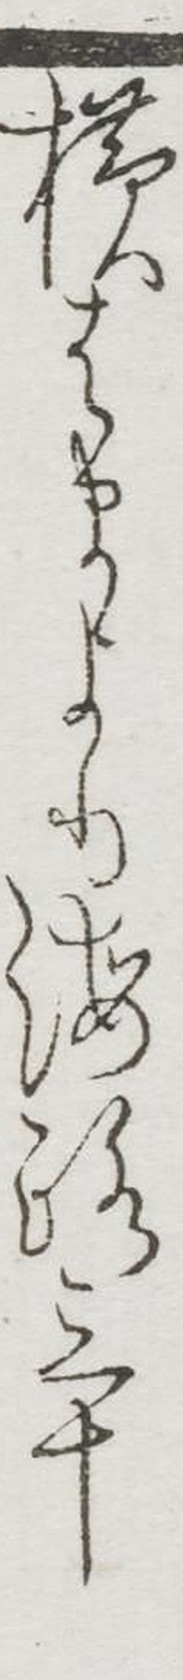横はまより海路三十
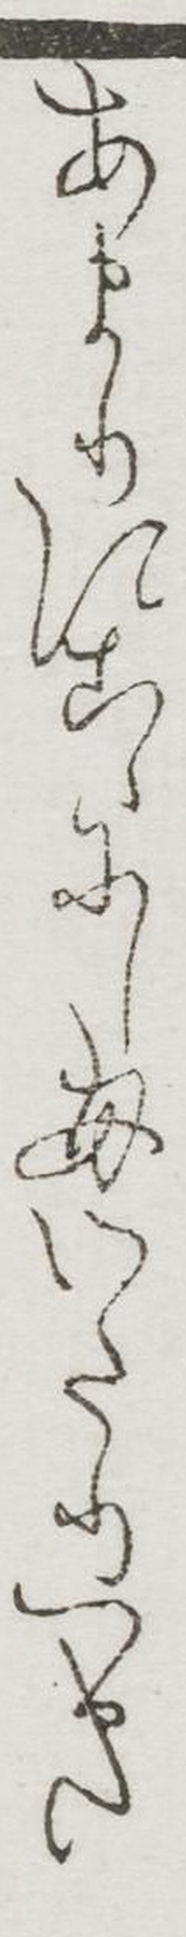あまりすこゝにしもいたりつき
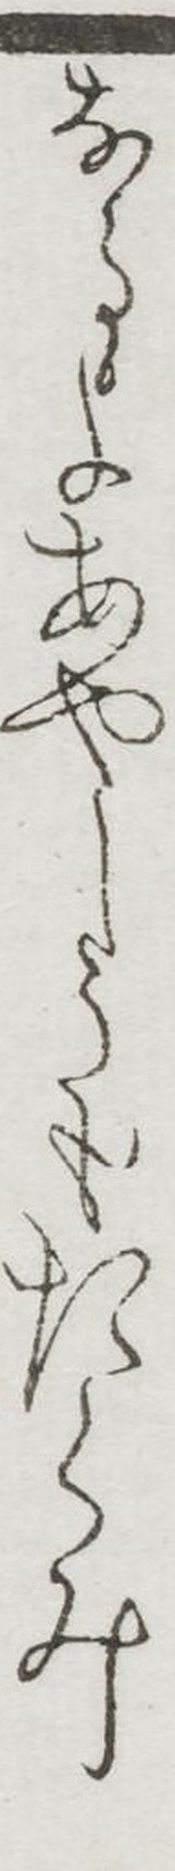なるよあやしうもたくみ
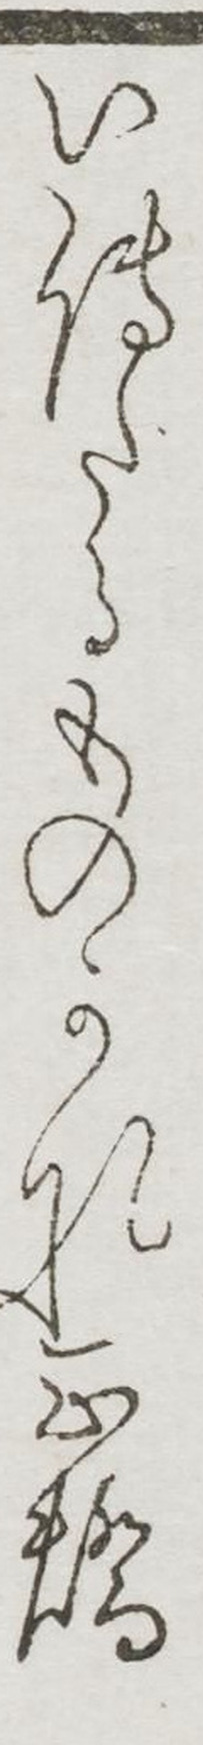いてたるものかな正矯

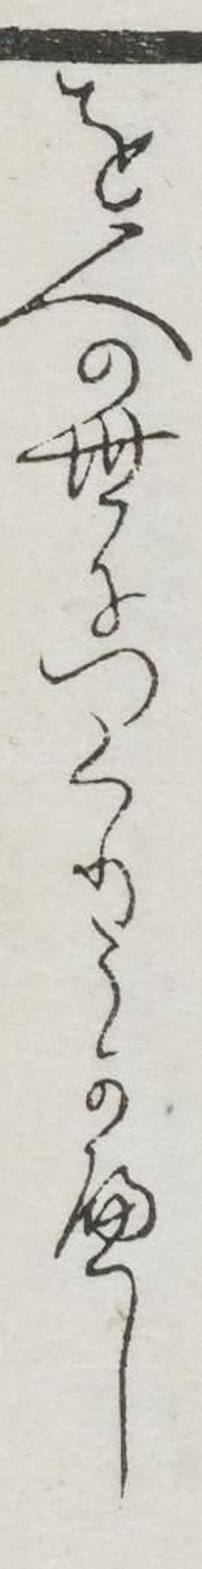を人の世につくりうかへし菊名
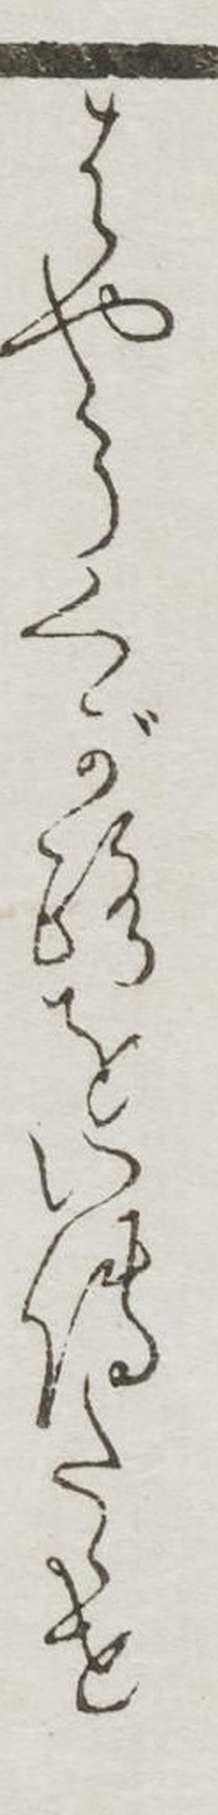はやうくが路をいてたゝせ金田
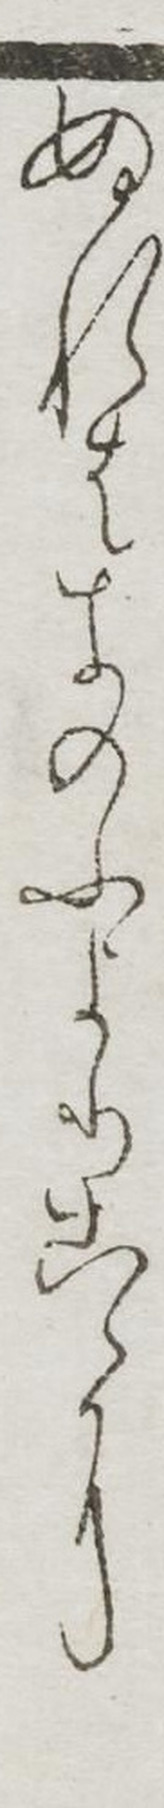ぬれはきのふよりこゝに
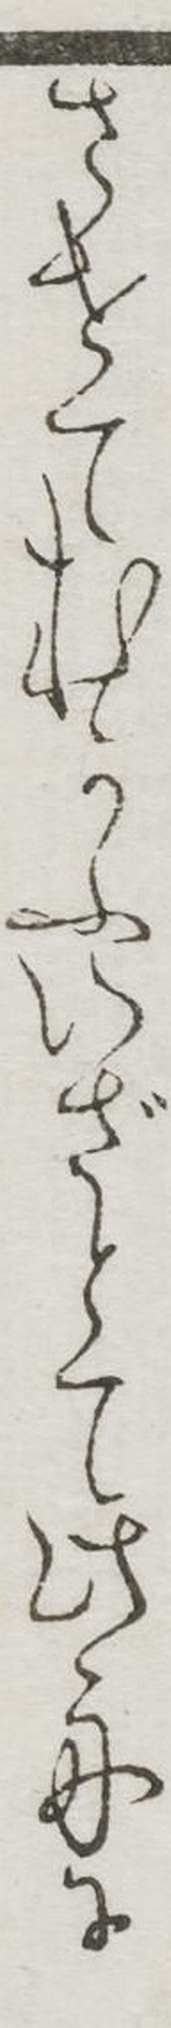させてむかふいざとて此舟に
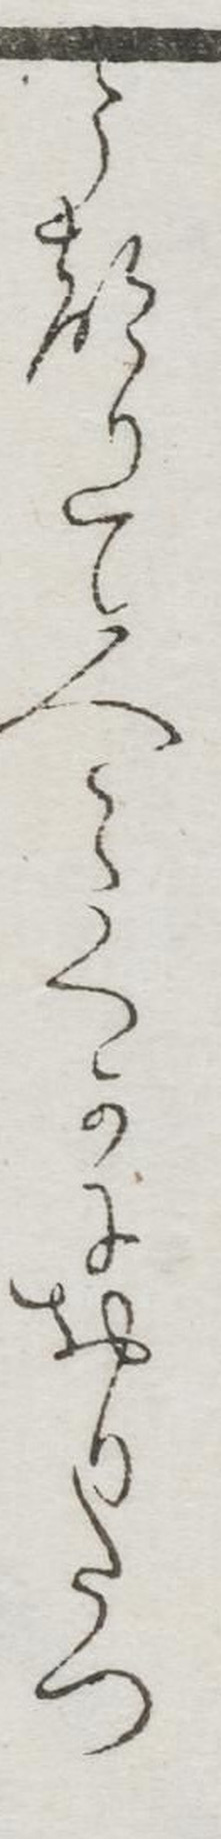うつりて人々くかにおりたつ三崎
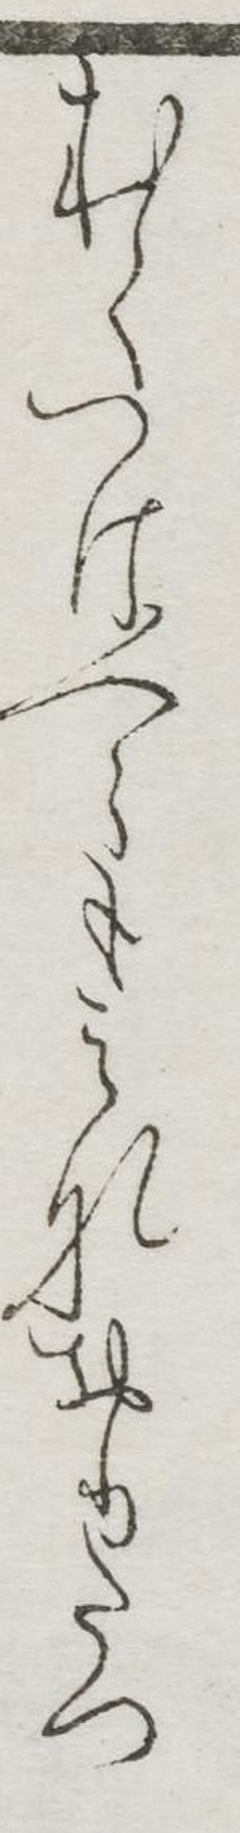むくつけへうもみなおりたつ
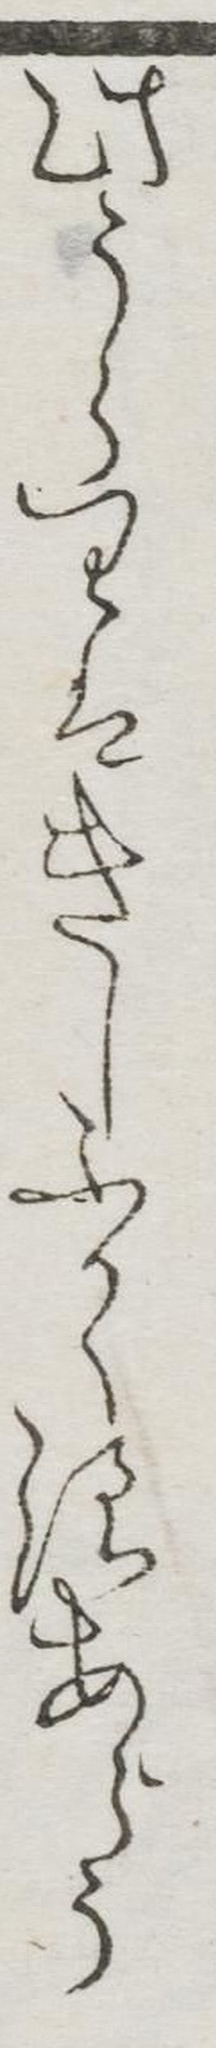此うらわはきしふかく浪あらう
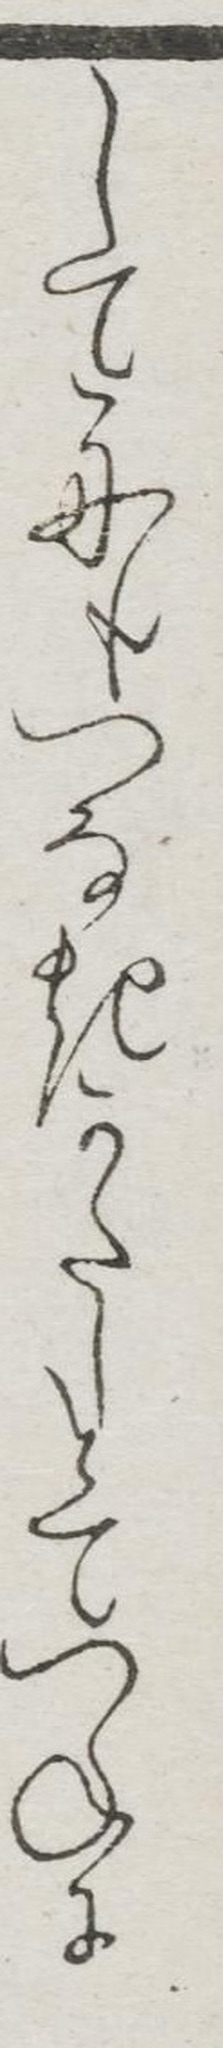して舟もつなきかたしとてつねに
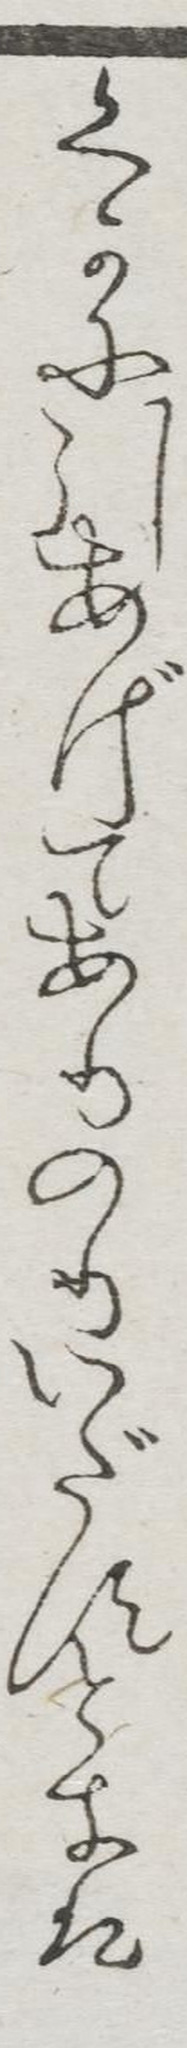くかに引あげてありのりいだすときは
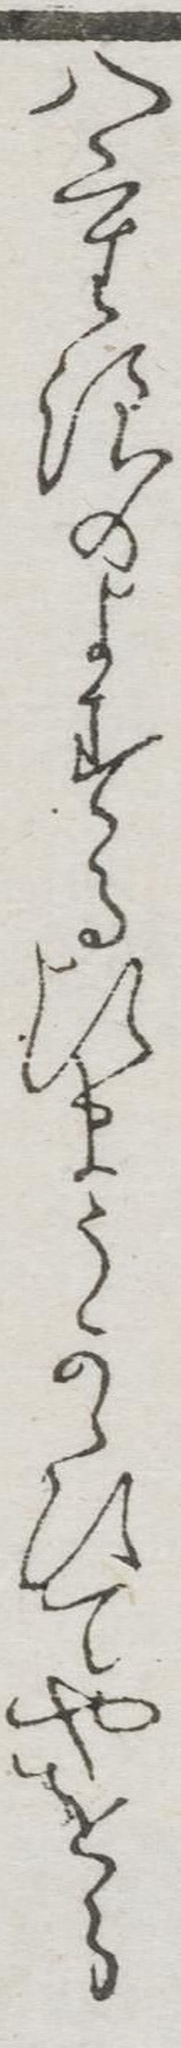八重浪のよするひまうかゝひてやをら
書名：挿画熱海日記　全
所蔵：東京大学地震研究所図書室 Earthquake Research Institute Library, The University of Tokyo, JAPAN
